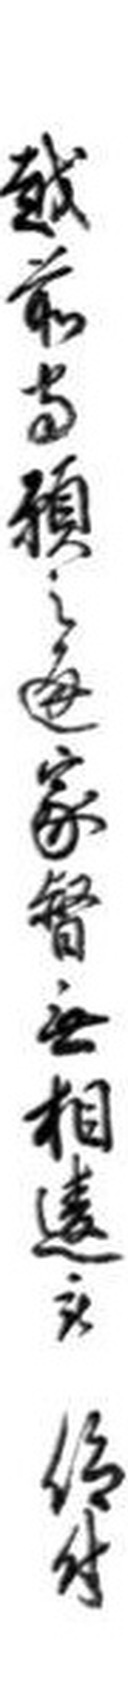越前守願之通家督無相違被仰付
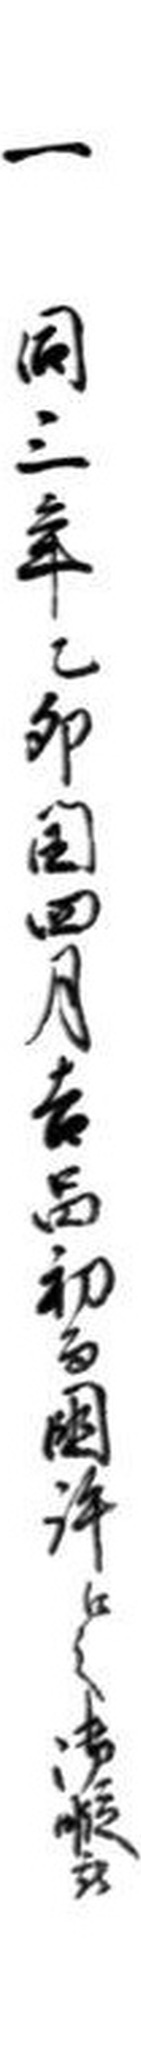一同三年乙卯閏四月吉品初而国許江之御暇被
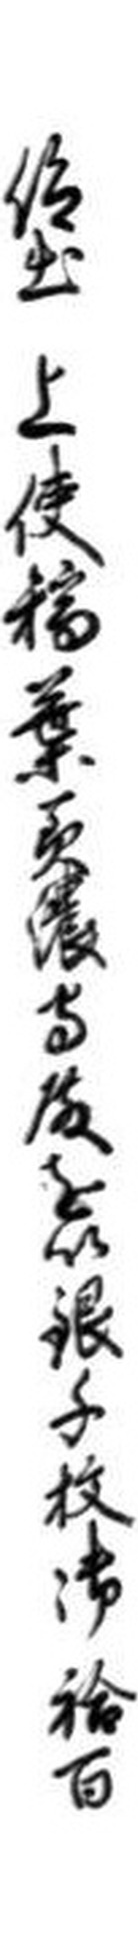仰出上使稲葉美濃守殿を以銀千枚御袷百
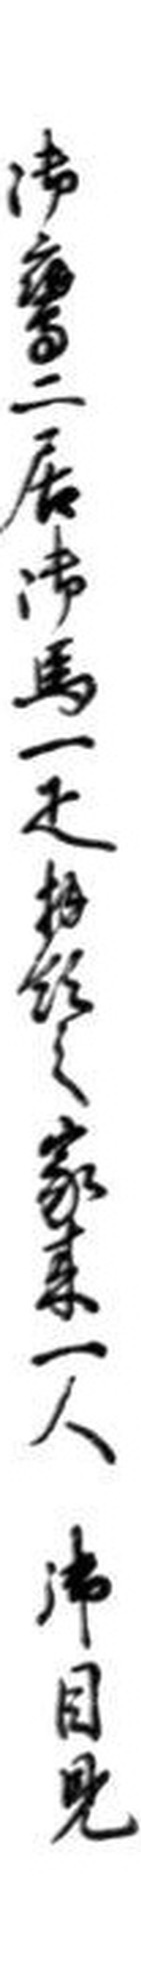御鷹二居御馬一疋拝領之家来一人御目見
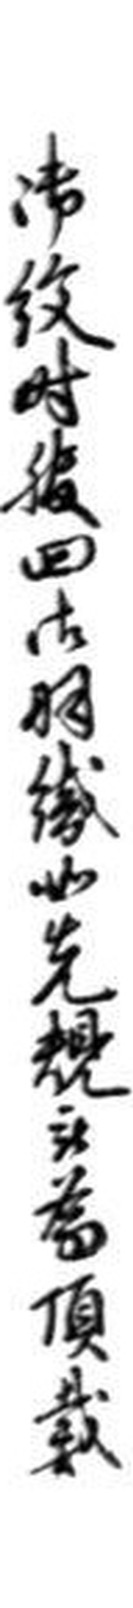御紋時服四御羽織如先規被為頂戴
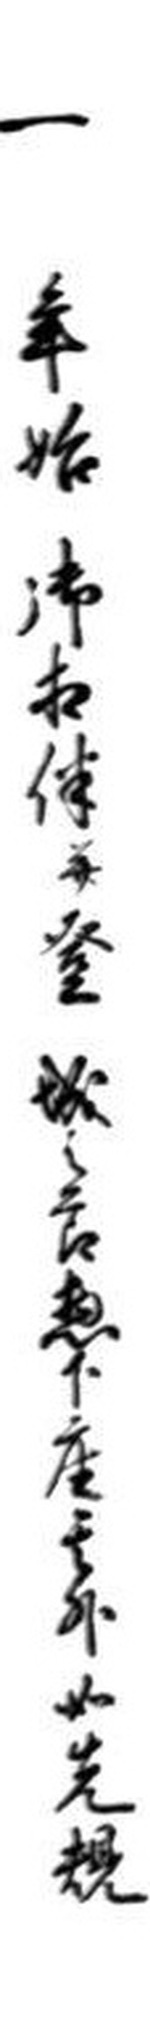一年始御相伴并登城之節惣下座其外如先規
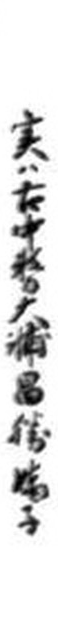実ハ右中務大輔昌勝嫡子
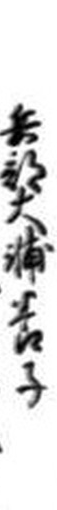兵部大輔養子少将
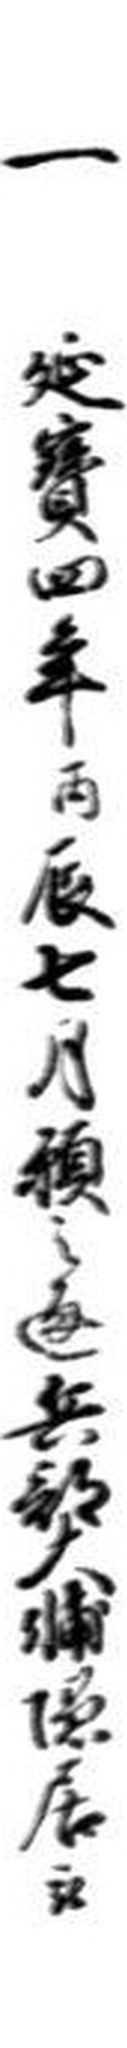一延宝四年丙辰七月願之通兵部大輔隠居被
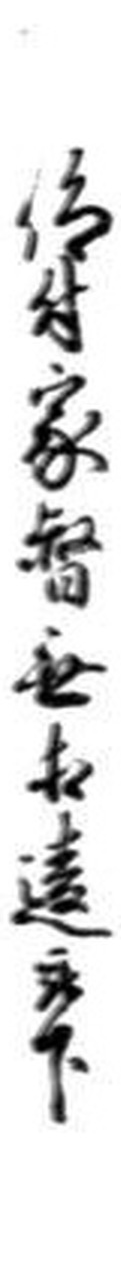仰付家督無相違被下
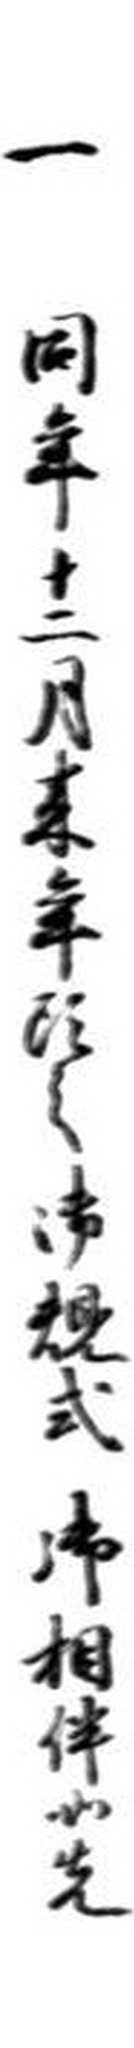一同年十二月来年頭之御規式御相伴如先
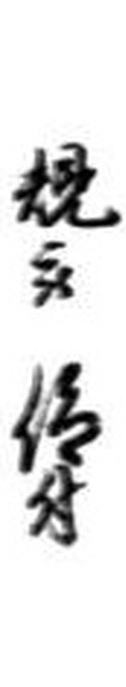規被仰付
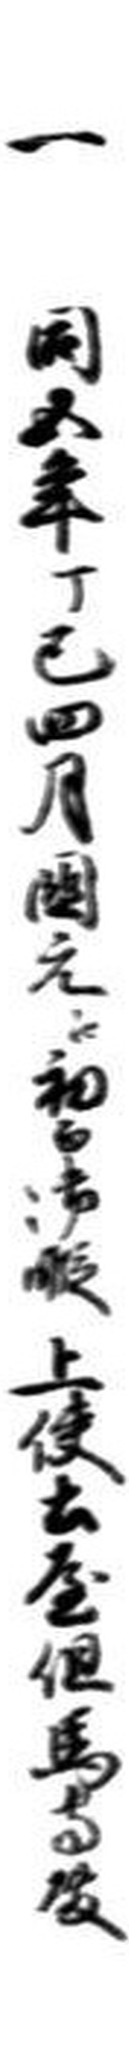一同五年丁巳四月国元江初而御暇上使土屋但馬守殿
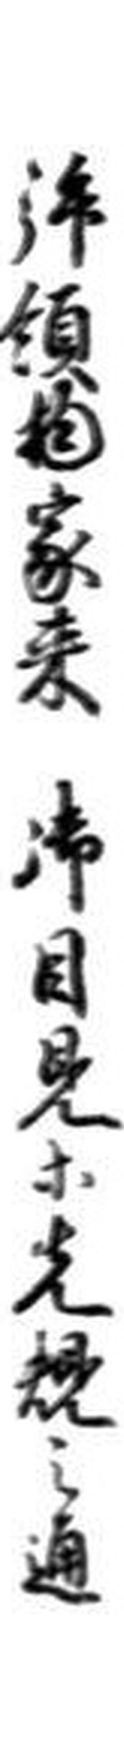拝領物家来御目見等先規之通
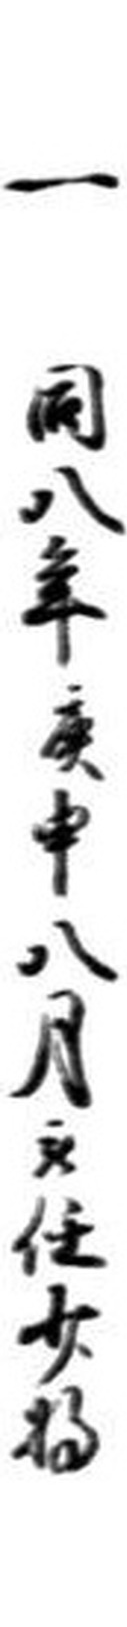一同八年庚申八月被任少将
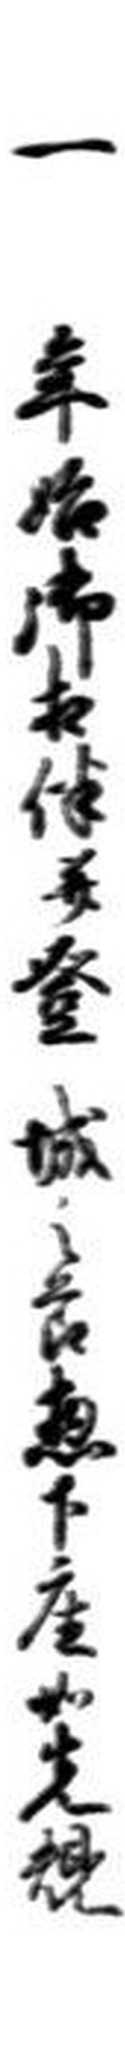一年始御相伴并登城之節惣下座如先規
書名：家譜 三十一 吉邦公 享保元年
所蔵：福井県文書館 Fukui Prefectural Archives
